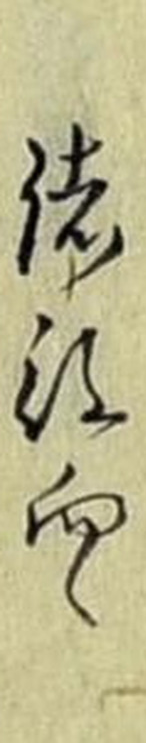諸役向へ
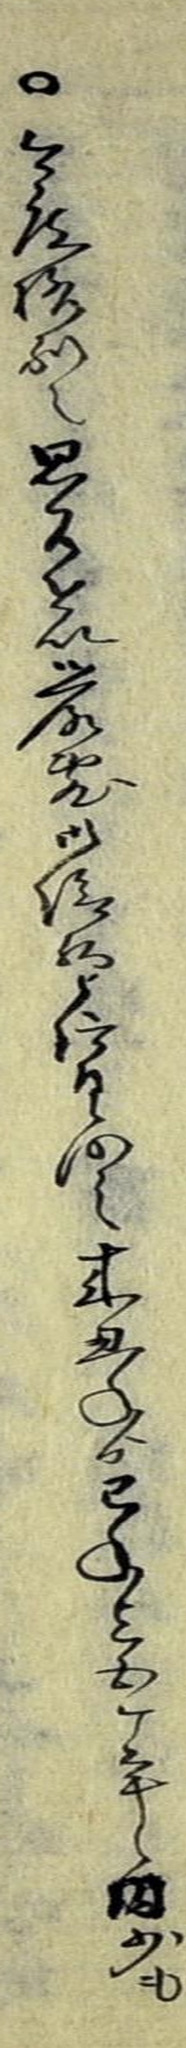〇今度格別之思召を以厳敷御倹約被仰付候仍之来丑年ゟ巳年迄五ヶ年之内少も
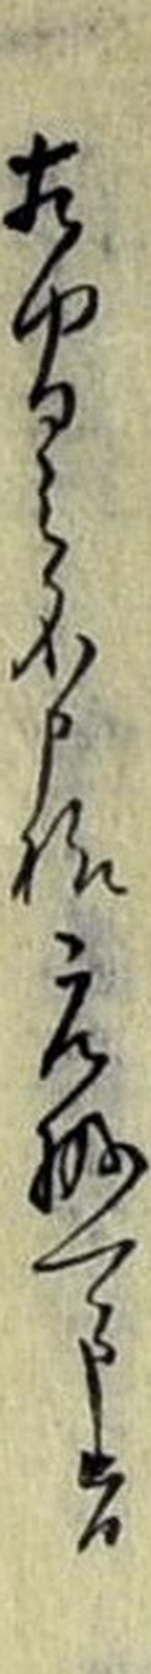相ゆるみ不申様取扱可申旨
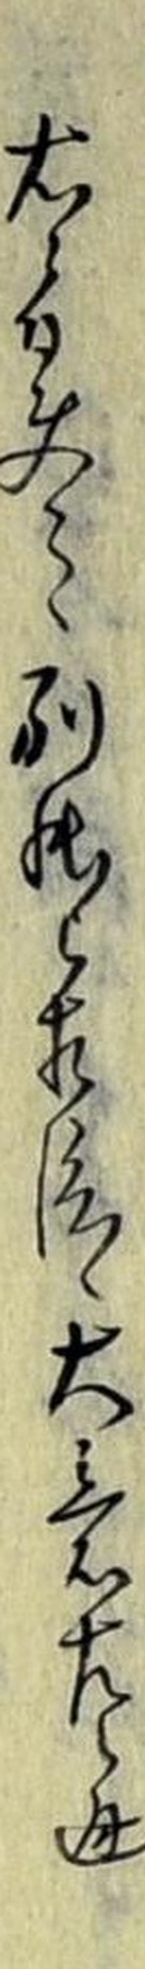右に付夫々へ別紙被相渡候大意左之通
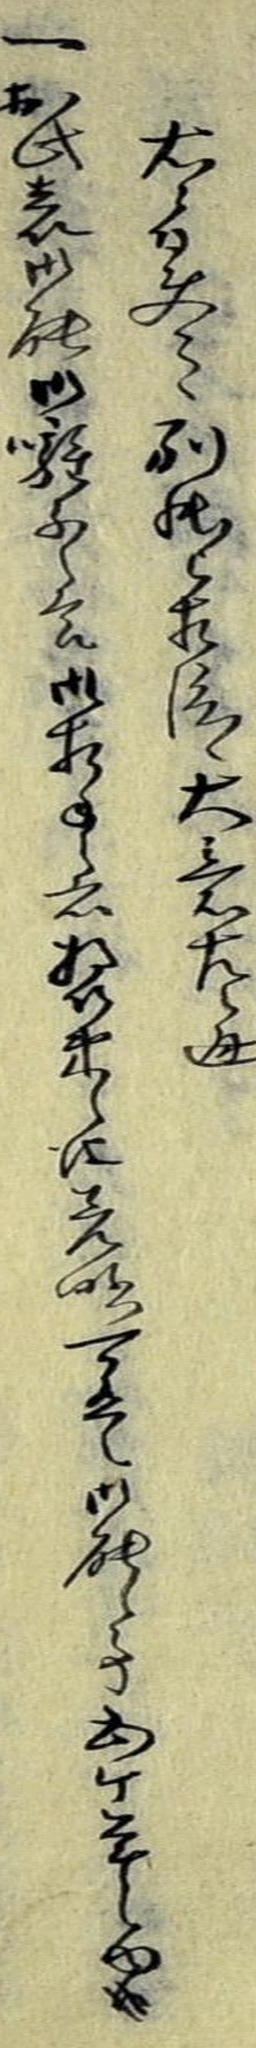一於此表御能御囃子之節御相手之者装束之儀差略可有之御能之事五ヶ年之内
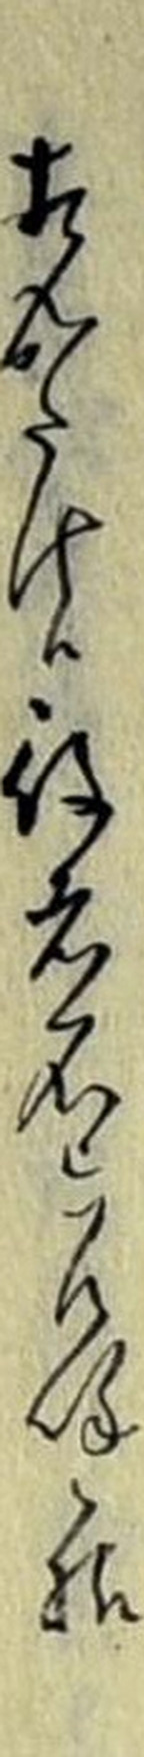相成たけは役者不被召呼候様
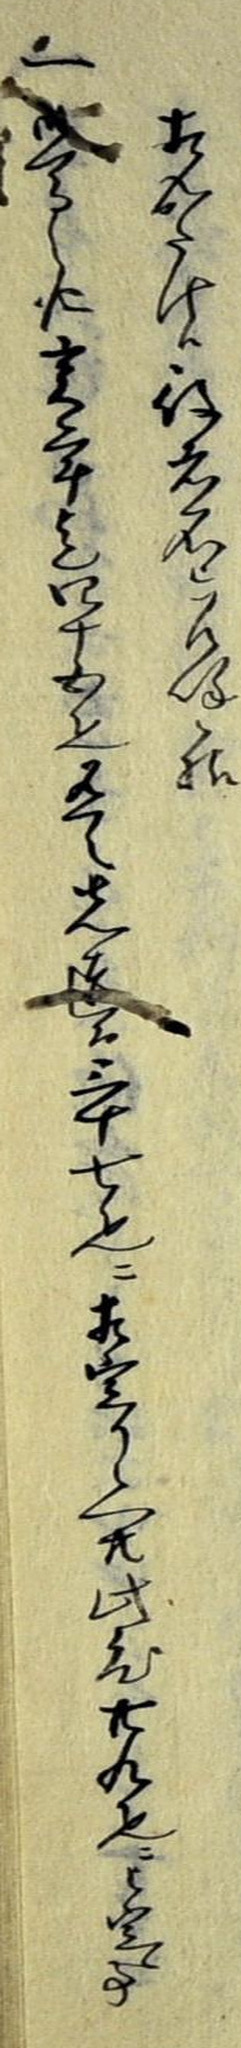一御馬之儀亥年迄四十五疋有之先達而三十七疋に相定り候へ共此度廿九疋に被定候事

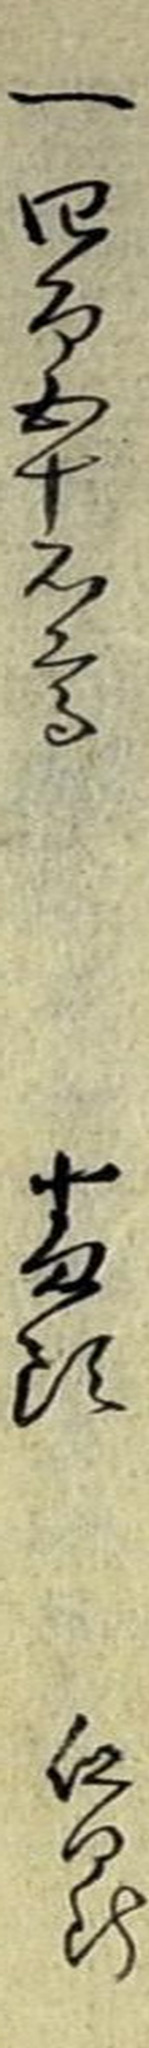一四百五十石高番頭但同断
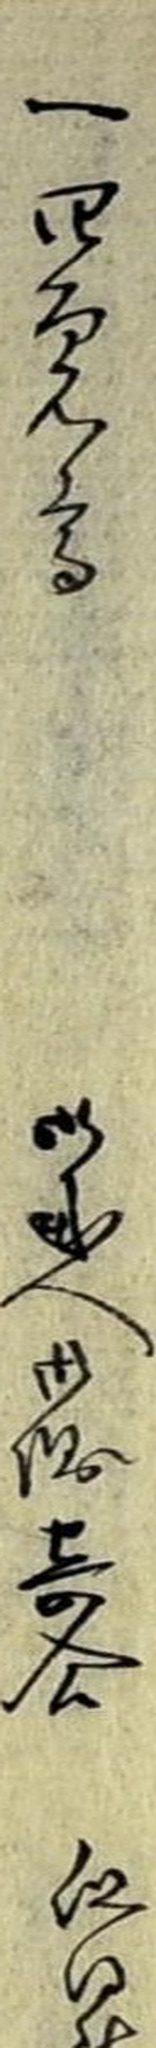一四百石高御用人御側寄合但同断
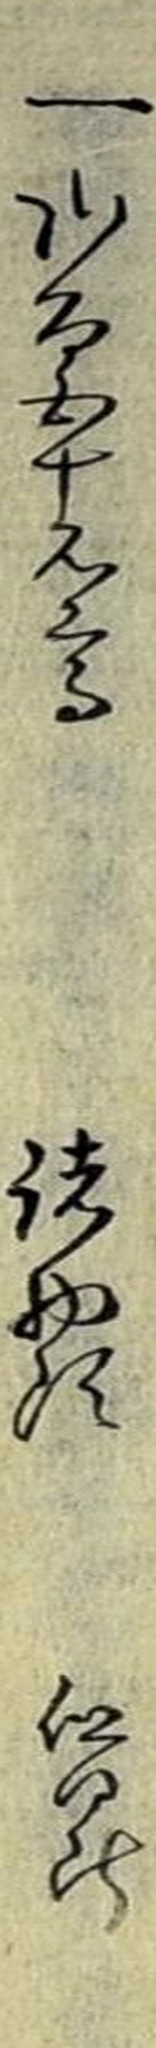一弐百五十石高諸物頭但同断
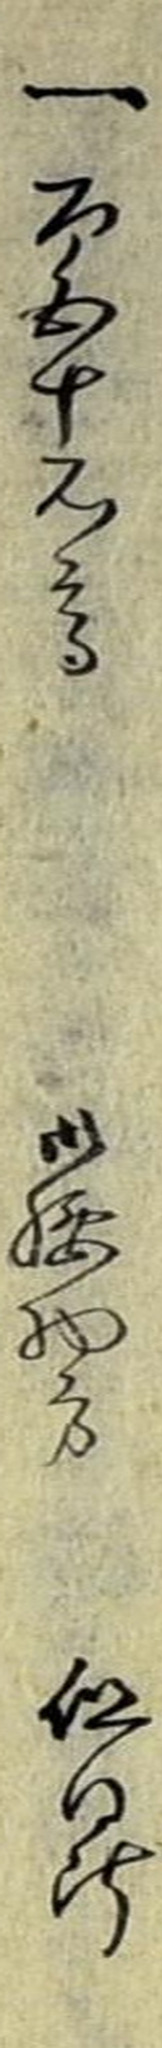一百五十石高御腰物方但同断
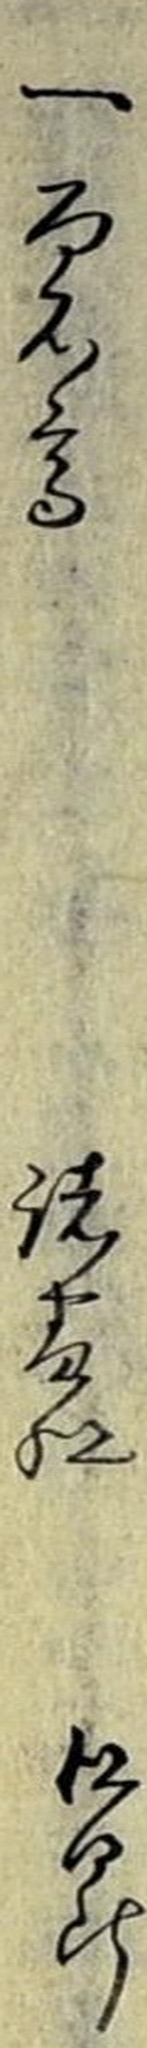一百石高諸番組但同断
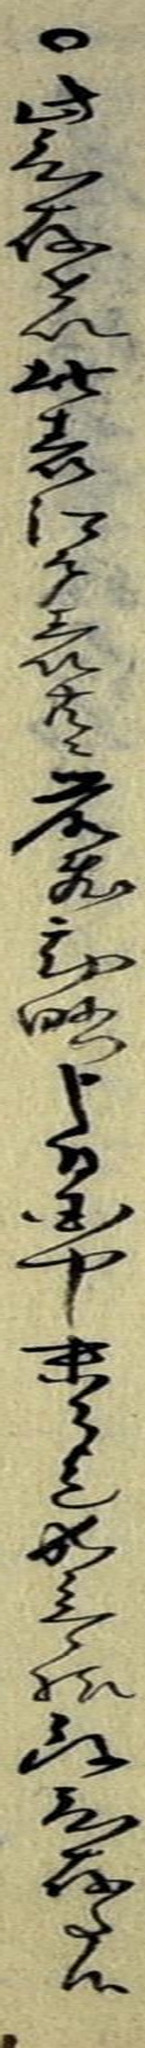〇此度存を以此表江戸表共に厳敷勘略申付国中末々迄成立候様致度存事候
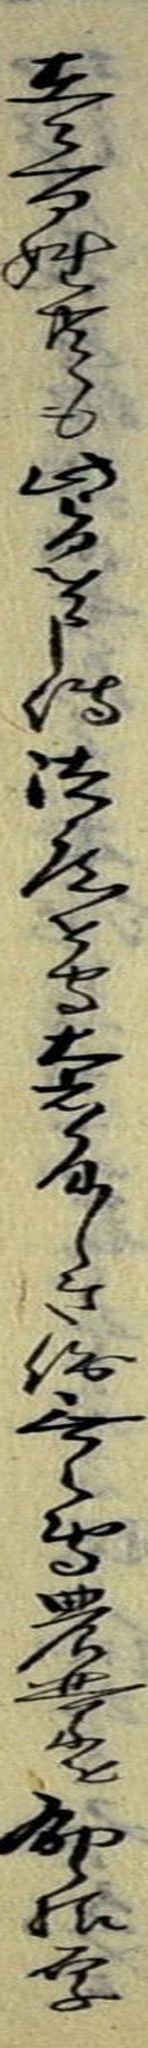在々百姓共へも此旨を申伝法度を守奢かましき儀無之専農業を励候様厚
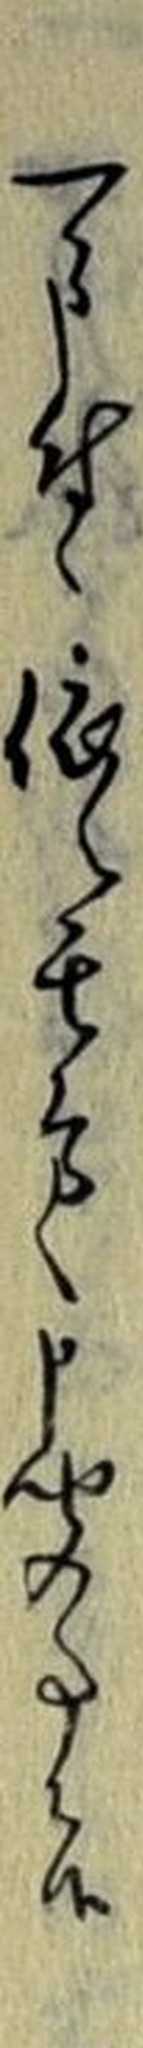可申付候依之其方へ申聞事に候
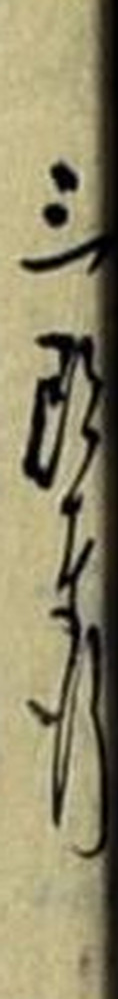四郡奉行
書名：命令之部 二
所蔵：福井県文書館 Fukui Prefectural Archives
